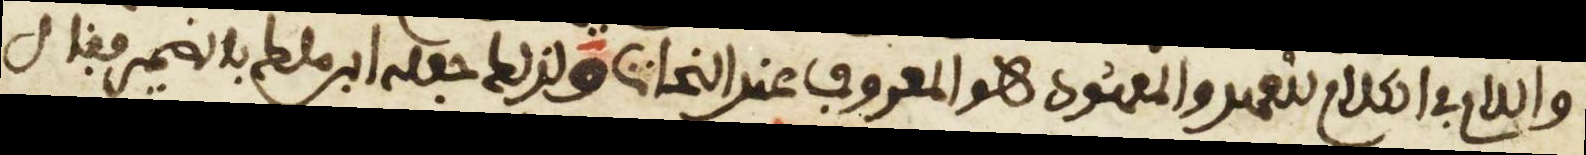و اللام في الكلام للعهد و المعهود هو المعروف عند النحات و لذلك جعله ابن ملك بالضمير فقال
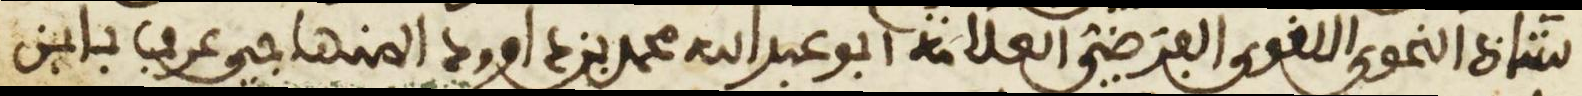ستاذ النحوى اللغوى الفرضي العلامة أبو عبد الله محمد بن داوود المنهاجي عرف بابن
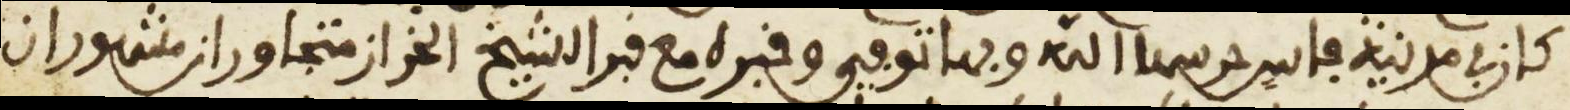كان في مدنية فاسر حرسل الله و بها توفي وقبره مع قبر الشيخ الخراز متجاور ان مشهوران
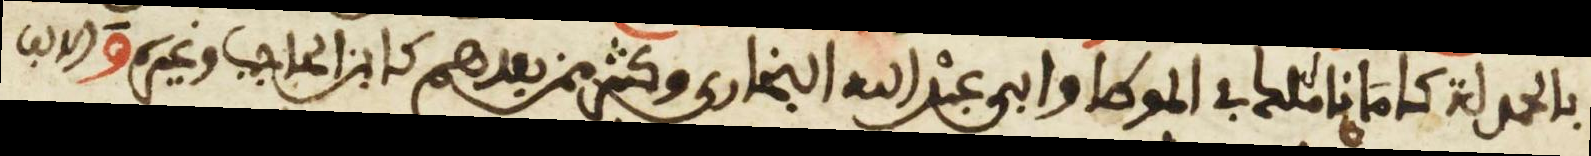بالحمدلة كامانا ملك في الموطا و ابى عبد الله البخارى وكثير ممن بعدهم كابن الحاجب و غيره والالف
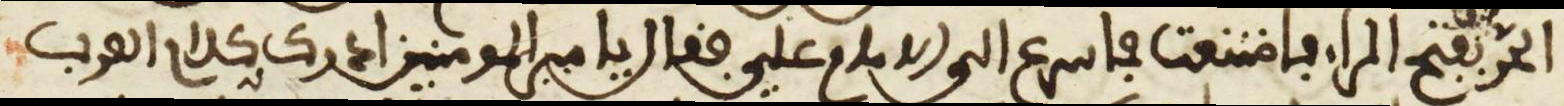الحر بقمح الراء فامتنعت فاسرع الى الامام علي فقال يامير المومنين ادرك كلام العرب
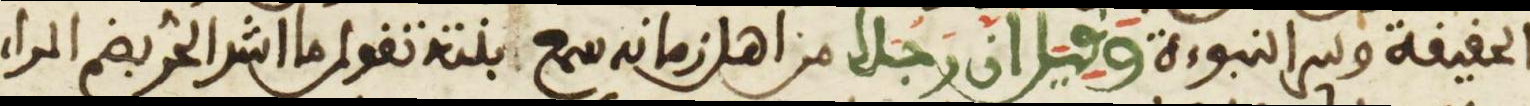الحقيقة و سر النبوءة و قيل ان رجلا من اهل زمانه سمع بنته تقول ما اشد الحر بضم الراء
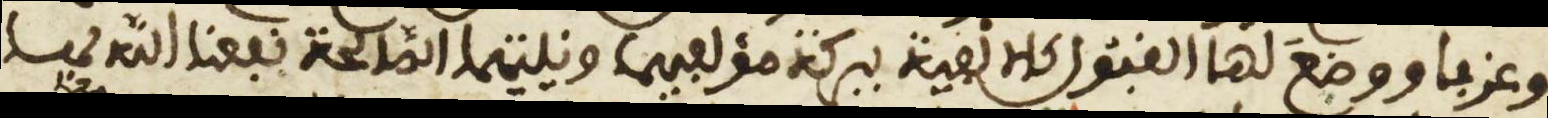و عزبا و وضع لها القبول كالالفية ببركة مؤلفيهما و نيتهما الصالحة نفعنا الله بهما
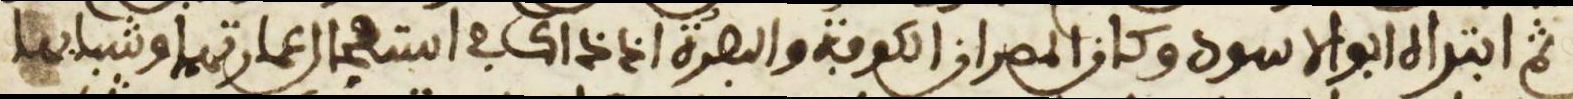ثم ابتداه أبو الأسود و كان المصران الكوفة و البصرة اذ ذاك في استعجال عمارتهما و شبابها
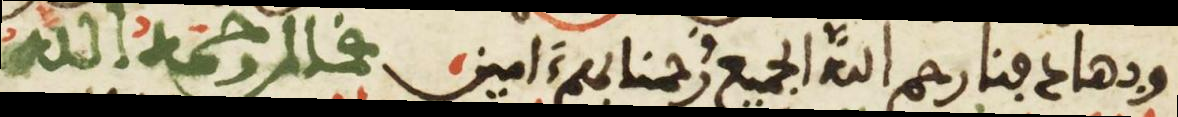و بهادفنا رحم الله الجميع رحمنا بهم أمين قال رحمه الله
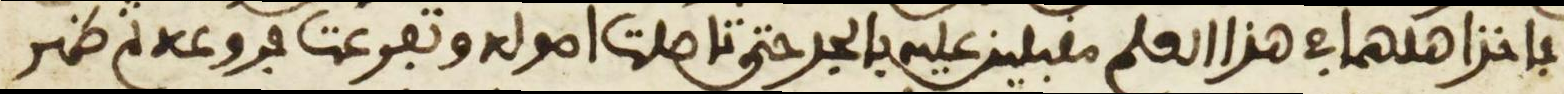فاخزاهلهما في هذا العلم مقبلين عليه بالجر حتى تاصلت اصوله وتفرعت فروعه ثم ظهر
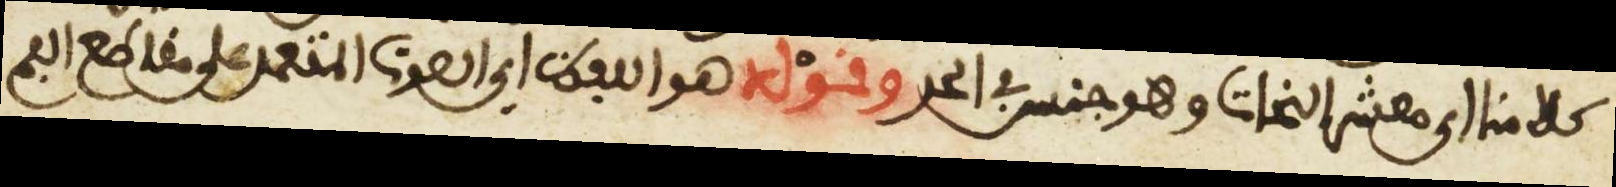كلامنا أي معشر النحات و هو جنس في الحد و قوله هو اللفظ أي الصوت المتعمد على مقاطع الفم
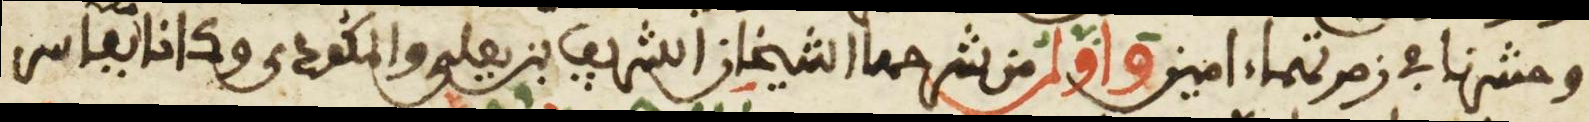و حشرنا في زصر تمما أمين و اول من شرحها اشيخان الشريف بن يعلى و المكودى و كانا معنا بفاس
